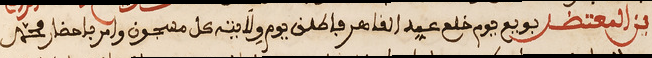بن المعتضر بويع يوم خلع عمه القاهر فاطلق يوم ولايته كل مسجون وامر باحضار محمد
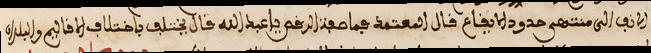الانف الى منتهى حدود الايقاع قال المعتمد فما صفة الرقص يا عبد الله قال يختلف باختلاف الاقاليم والبلدان
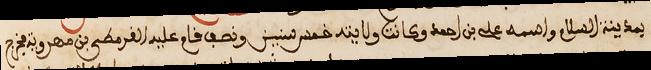بمدينة السلام واسمه على بن احمد وكانت ولايته خمس سنين ونصف قام عليه القرمطى بن مهروية فخرج
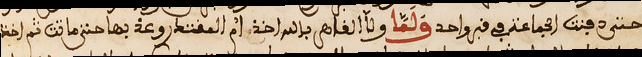حتى دفنت الجماعة في قبر واحد ولما ولا القاهر بالله اخذ ام المقتدر وعذبها حتى ماتت ثم اخذ
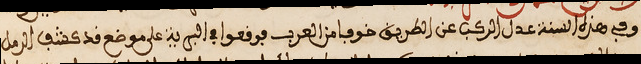وفي هذه السنة عدل الركب عن الطريق خوفا من العرب فوقعوا في البرية على موضع قد كشف الرمل
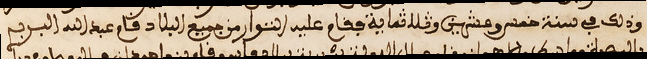وذلك في سنة خمس وعشرين وثلاثماية فقام عليه التوار من جميع البلاد قام عبد الله البربرى
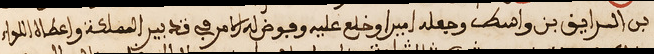بن المرايق بن واسط وجعله اميرا وخلع عليه وفوض له الامر في قد بين المملكة واعطاه اللواء
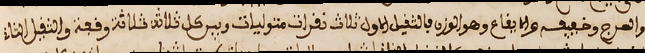والمرج وخفيفه والايقاع وهو الوزن فالثقيل الاول ثلاث نقرات متوليات وبين كل ثلاثة ثلاثة وقفة والثقيل الثانى
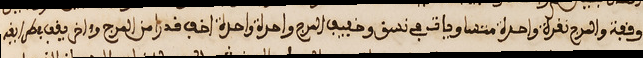وقفة والمرج نقرة واحدة متساو يات في نسق وخفيف المرج واحدة واحدة اخف قد رامن المرج وءاخر يقف في طر ايغه
